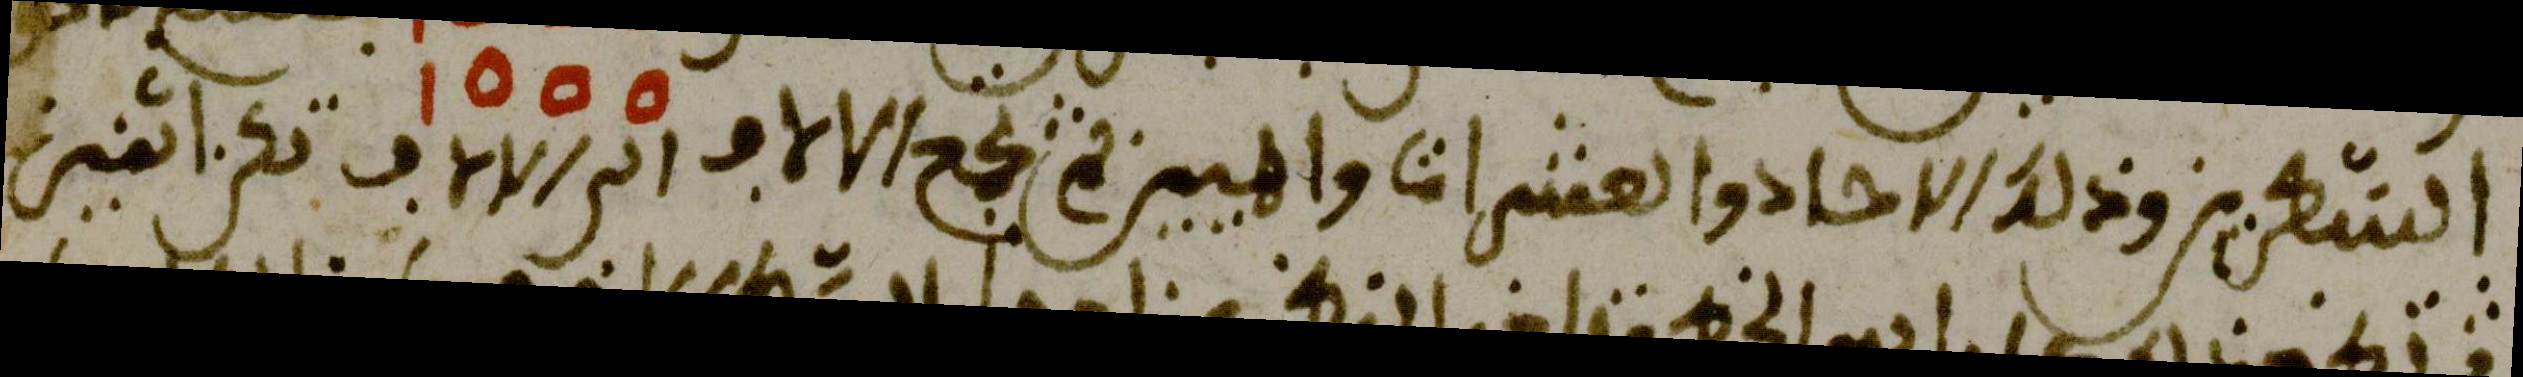السطرين وذلك الاحاد والعشرات واهينن ثم تجمع الالاف الى الالاف تكن اثنين
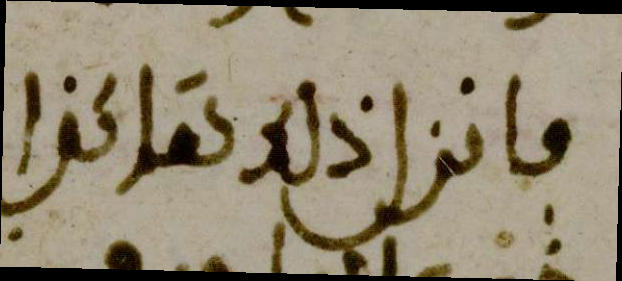فانزل ذلك هاكذا
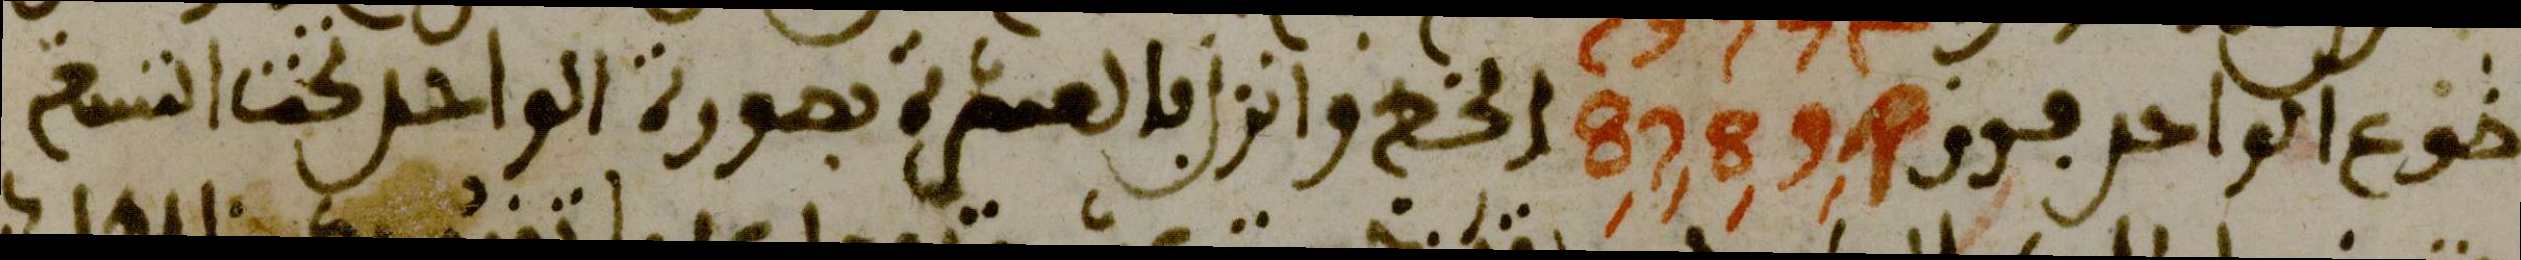ضوع الواحد فوق 87897 الخط وانزل فالعشرة بصورة الواحد تحت التسعة
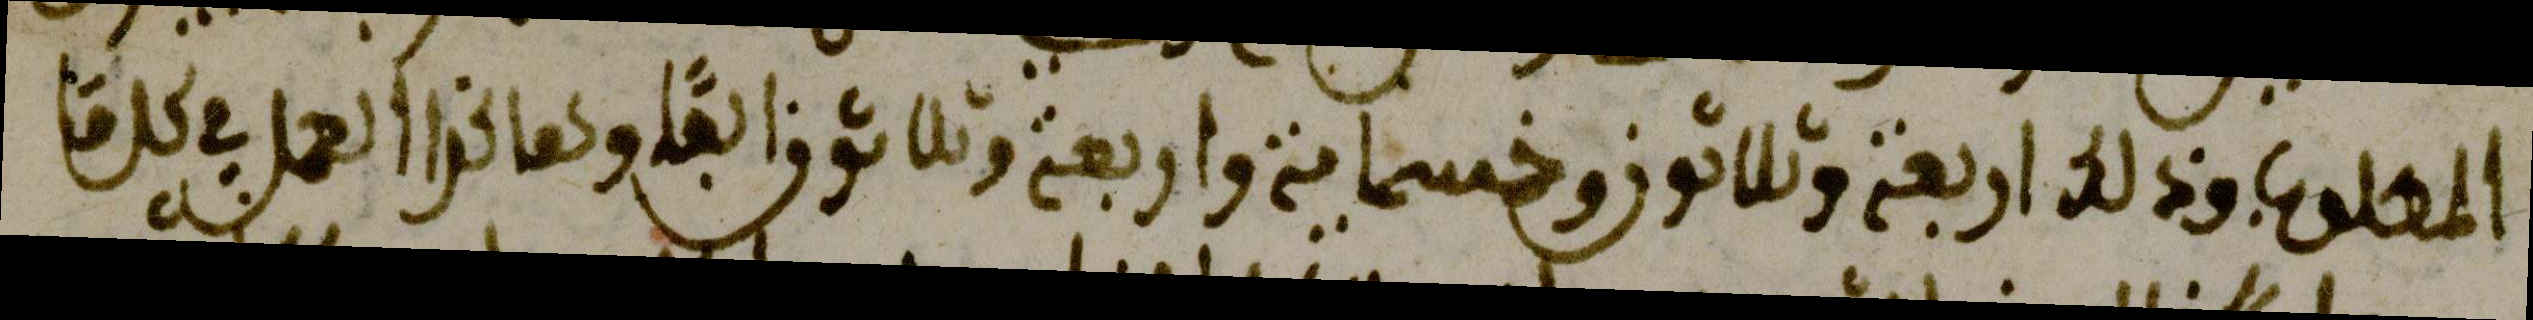المطلوب وذلك اربعة وثلاثون وخمسماية واربعة ثلاثون الفا وهاكذا العمل في كل ما
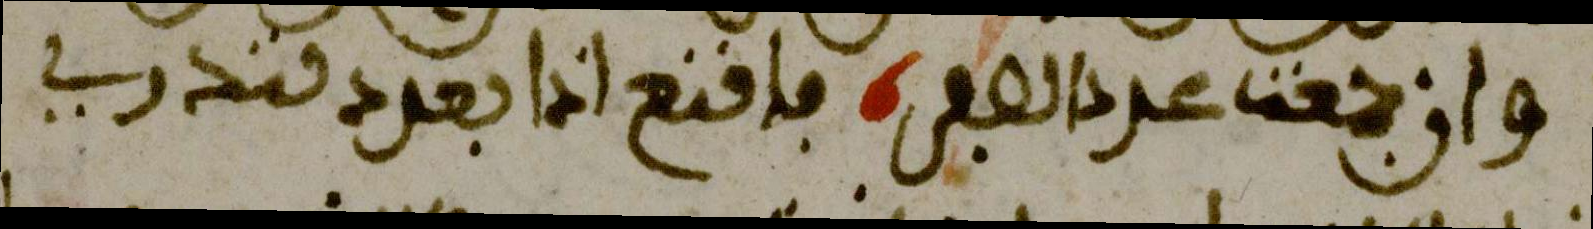وان جمعت عدد الصفر فاقنع اذا بعدد لتدري
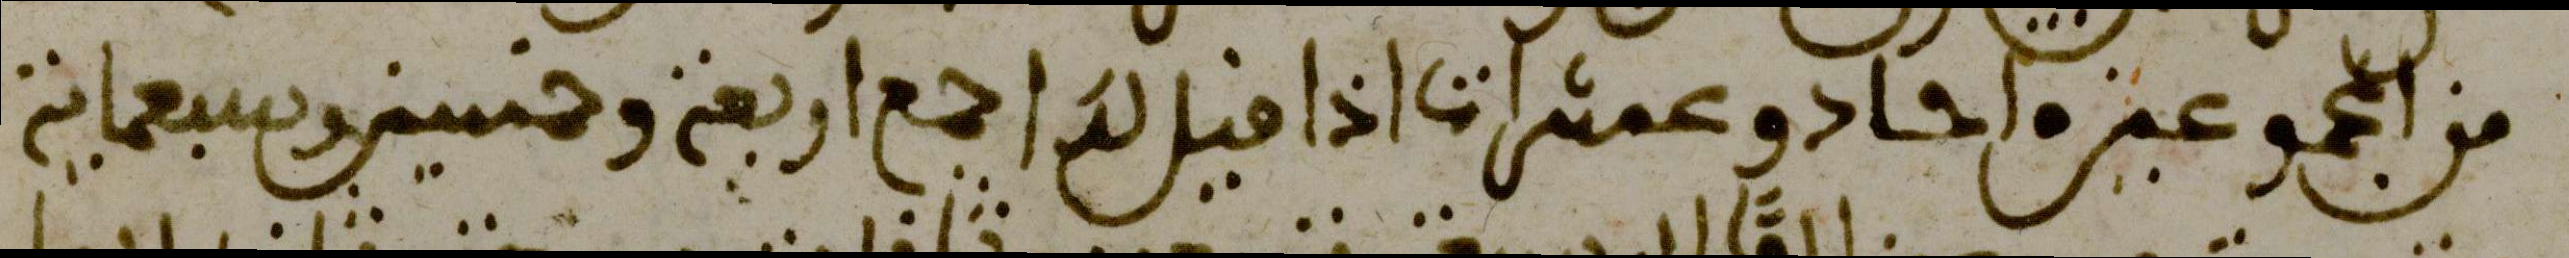من المجموعين ءاحاد وعشرات اذا قيل لك اجمع اربعة وخمسين وسبعماية
